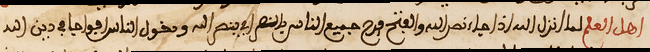اهل العلم لما نزل الله اذا جاء نصر الله والفتح فرح جميع الناس بالنصر في بنصر الله دخول الناس فواجا في دين الله
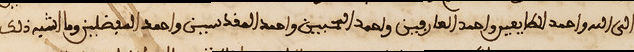الى الله واحمد الطايعين واحمد العارفين واحمد المحبين واحمد المقدسين واحمد المفضلين وما اشبه ذلك
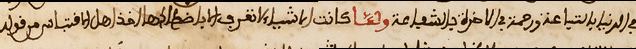في الدنيا بالتباعة ورحمة في الاخرة بالشفاعة ولما كانت الاشياء لا تعرف الا باضطاطها اخذ اهل الاقتباس من قوله
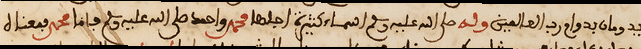يدومان بدوام رب العالمين وله صلى الله عليه وسلم اسماء كثيرة اجلها محمد واحمد صلى الله عليه وسلم فاما محمد فمعناه
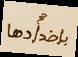باضدادها
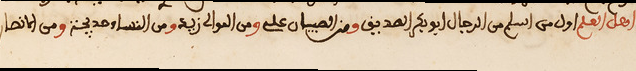اهل العلم اول من اسلم من الرجال ابو بكر الصديق ومن الصبيان على ومن الموالى زيد ومن النساء وحديجة ومن الانصار
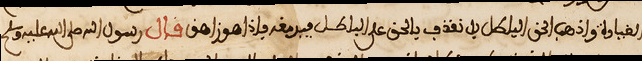الغياوة واذهب الحق الباطل بل نقذف بالحق على الباطل فيدمغة فاذا هو زاهق قال رسول الله صلى الله عليه وسلم
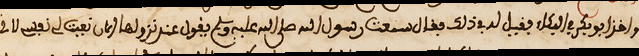واخذ ابو بكر في البكاء فقيل له في ذلك فقال سمعت رسول الله صلى الله عليه وسلم يقول عند نزولها الان نعيت لى نفسى لانى
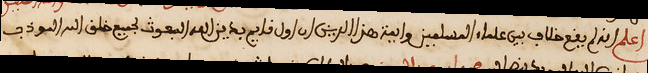اعلم انه لم يقع خلاف بين علماء المسلمين وايمة هذا الدين ان اول قايم بدين الله المبعوث لجميع خلق الله الموذب
